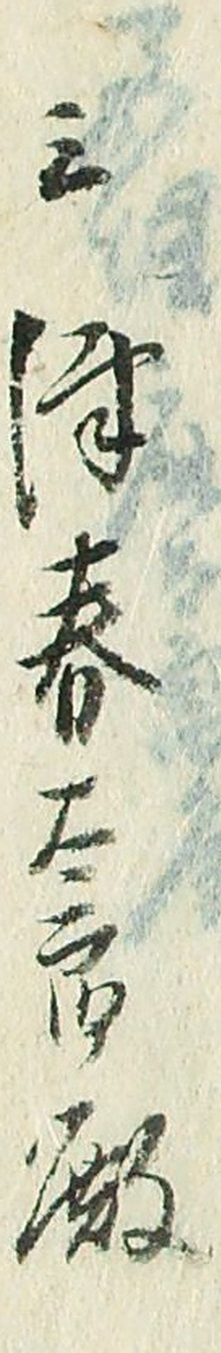三沢春太郎殿

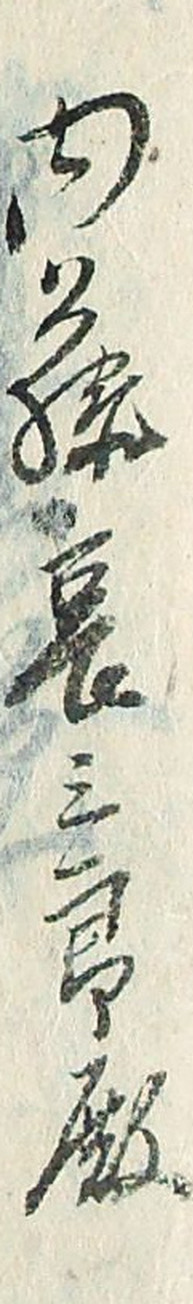内藤長三郎殿
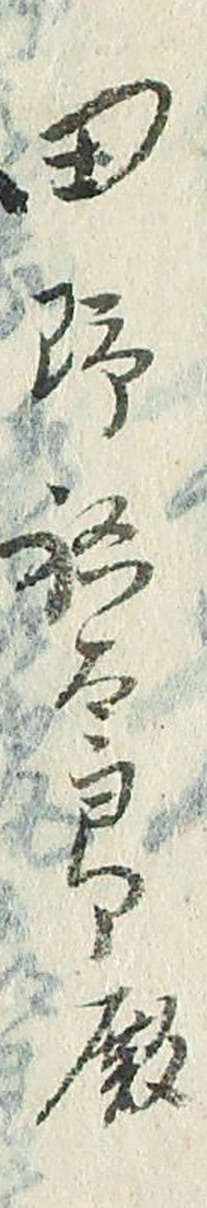田野祐太郎殿
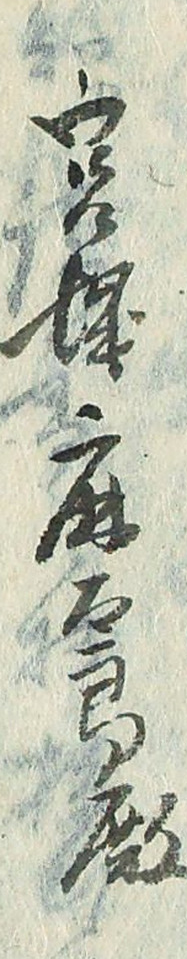宮城麻太郎殿
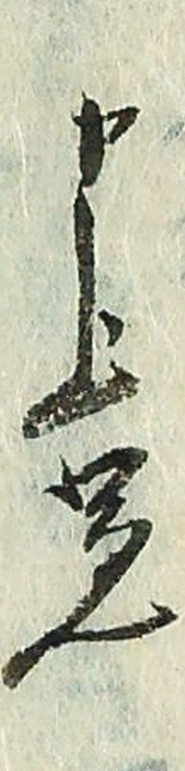申上覚
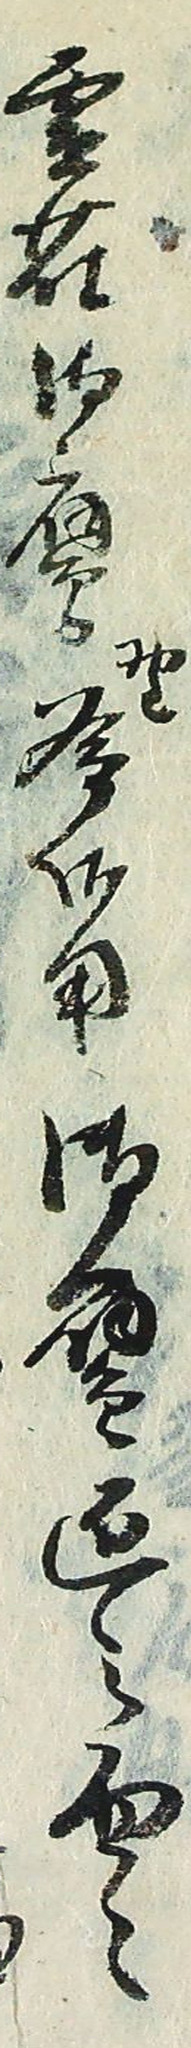雲雀御鷹野為御用御鷹匠之面々
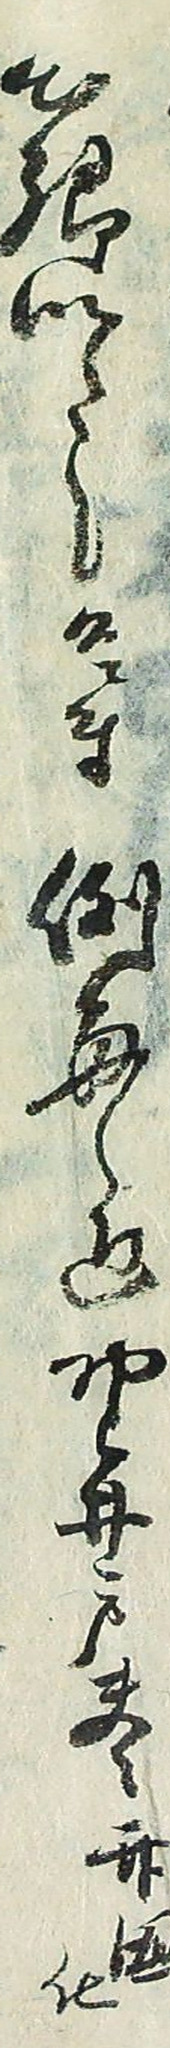出郷いたし候に付例毎之通野井戸夫々竹囲仕
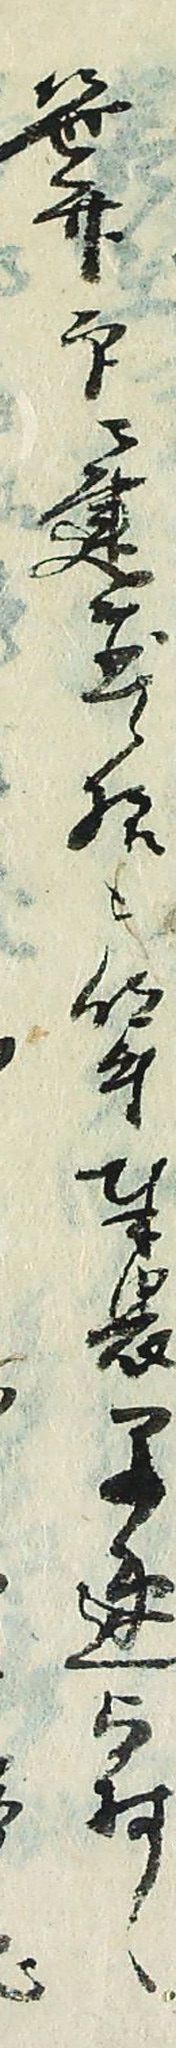笹竹印に建置候様被仰付奉畏早速与村へ
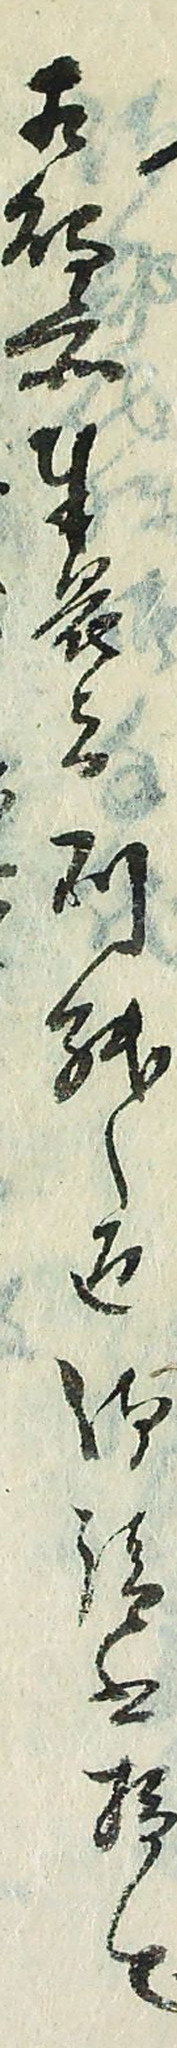相触候所奉畏旨別紙之通御請書指出
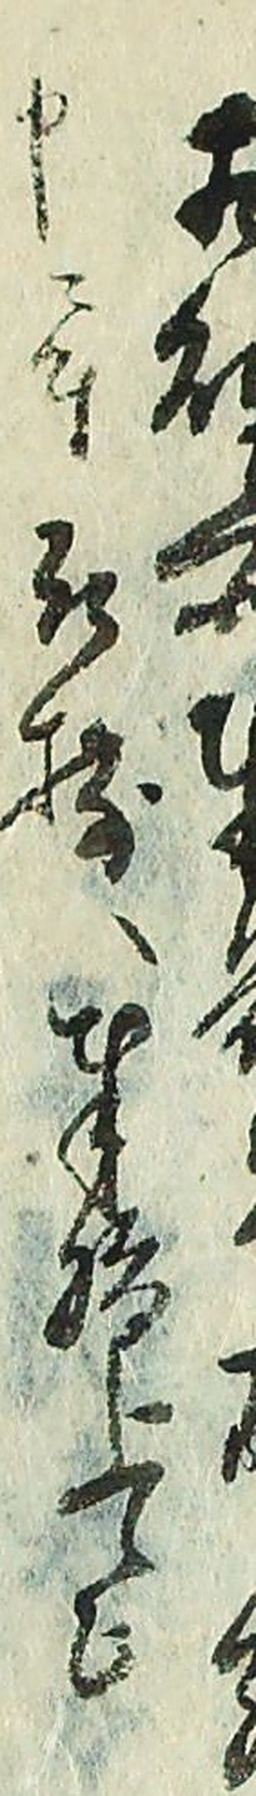申に付取揃へ奉指上候以上
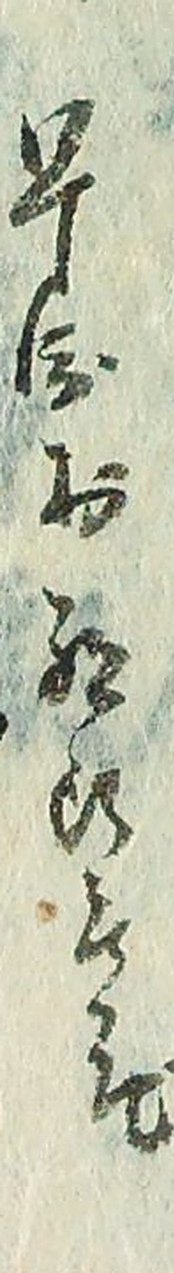早淵村組頭庄屋
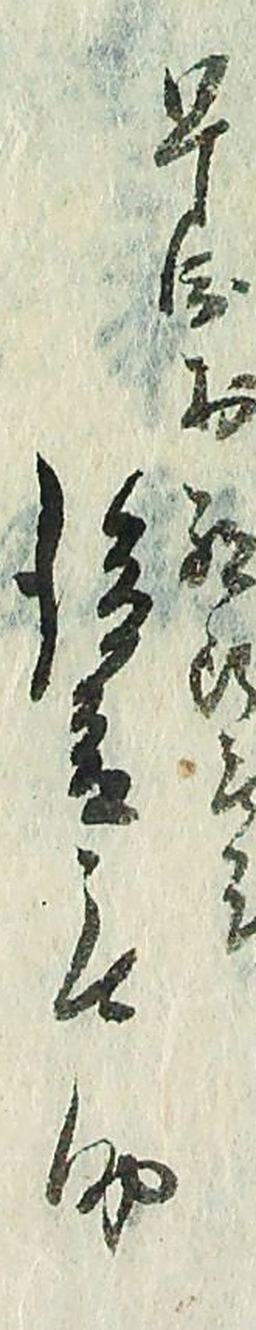後藤庄助
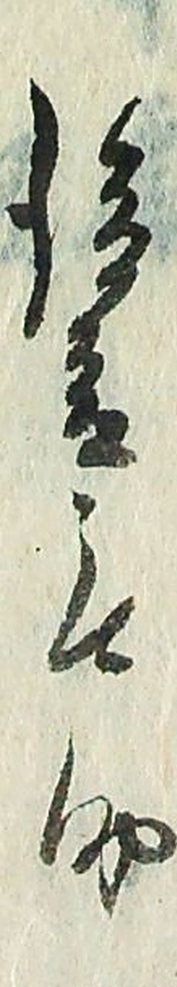後藤庄助
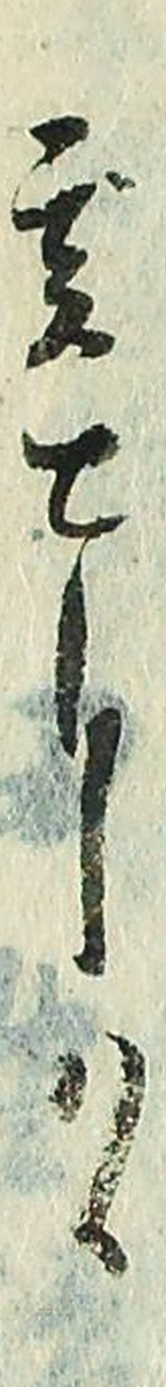亥七月八日
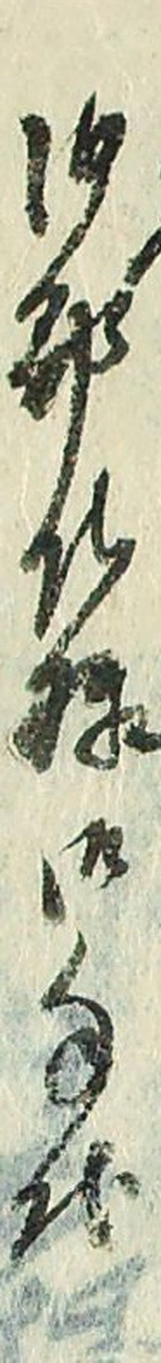御郡代様御手代
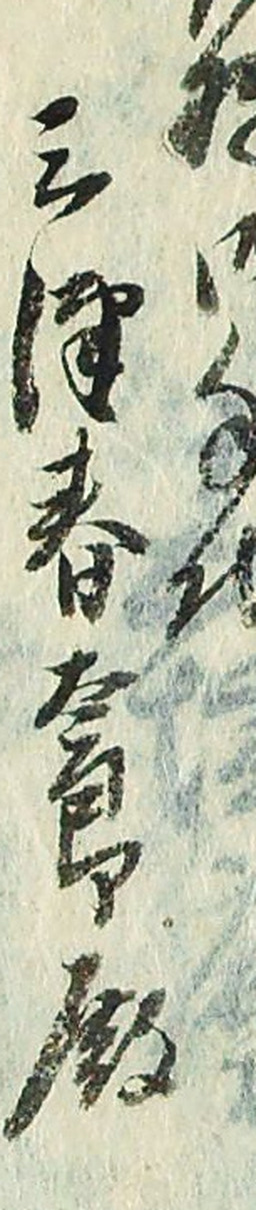三沢春太郎殿
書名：諸御用御□受書控
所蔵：鳴門教育大学 Naruto University of Education
